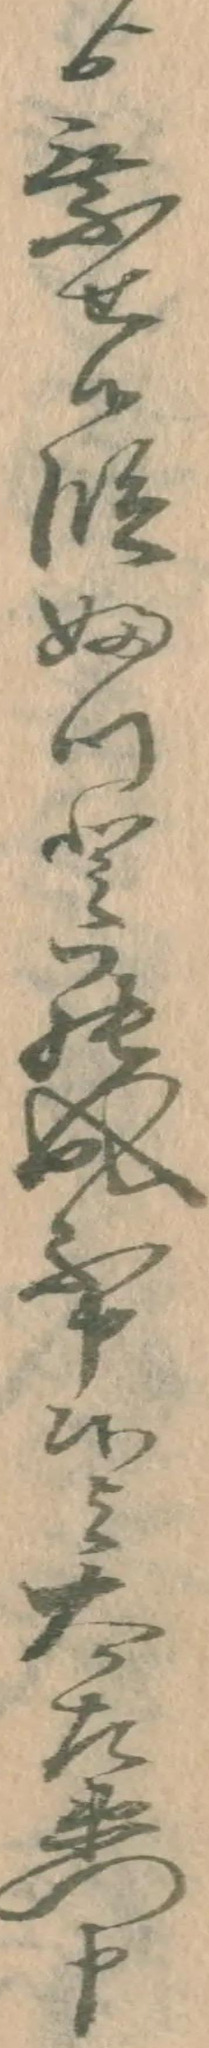ゟ乗せ候段婦川登罷成ふ申候与太左衛門申
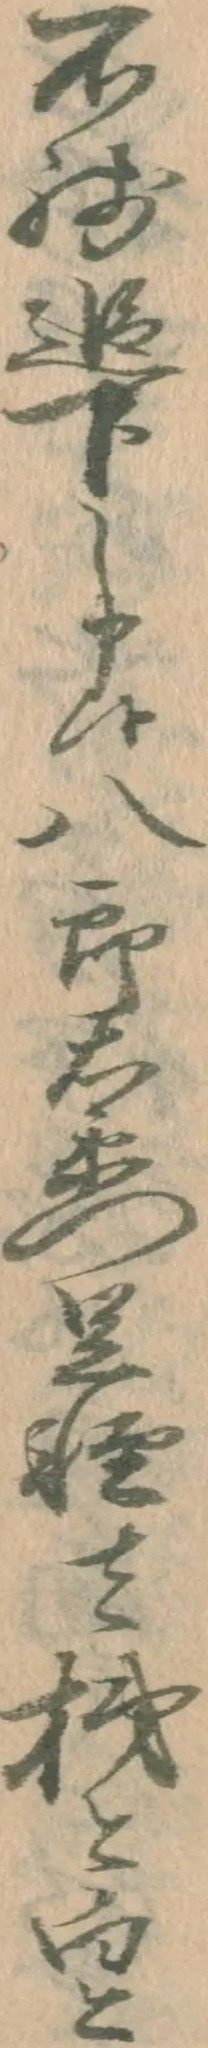不残追下し申候八郎右衛門足軽者梯と白と
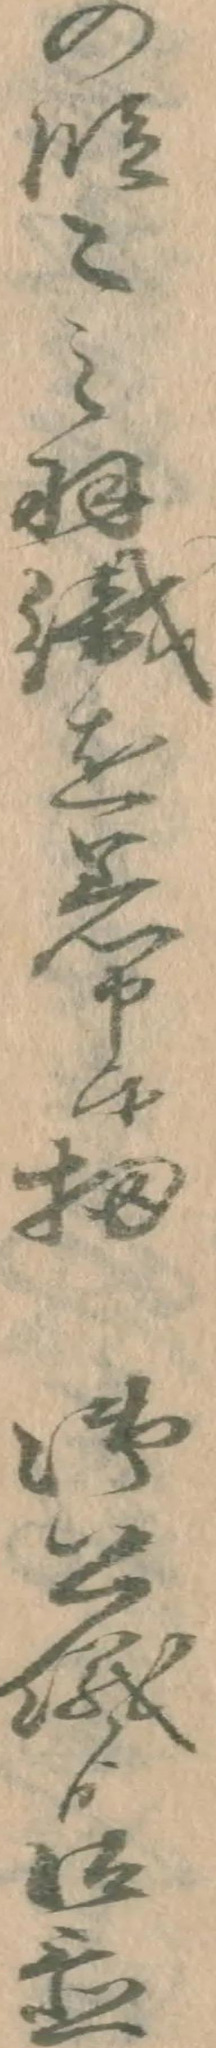の段々之羽織を着申候扨御公儀ゟ御置
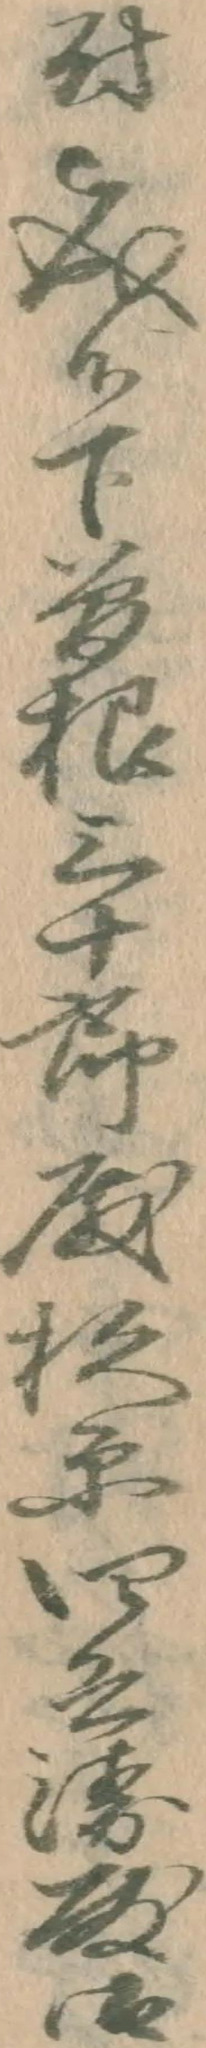付被成候下曽根三十郎殿杉原四兵衛殿御
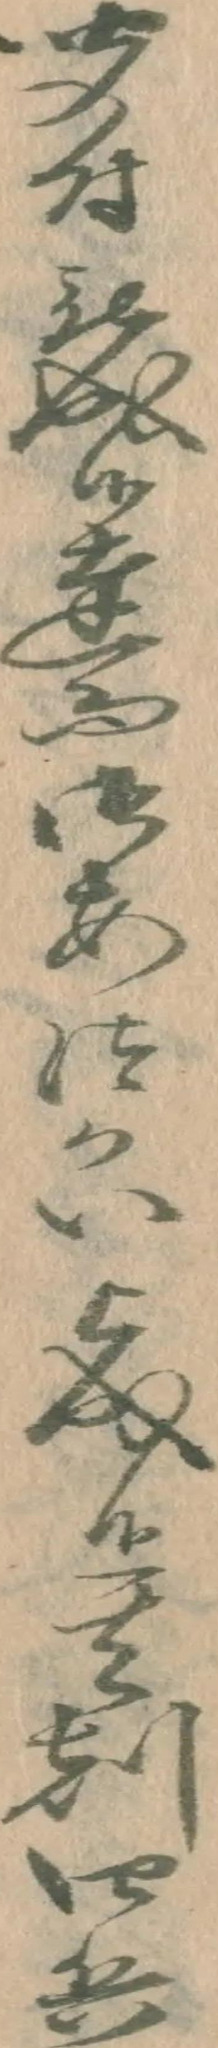聞付被成候達而御安徒かい被成候其刻四兵
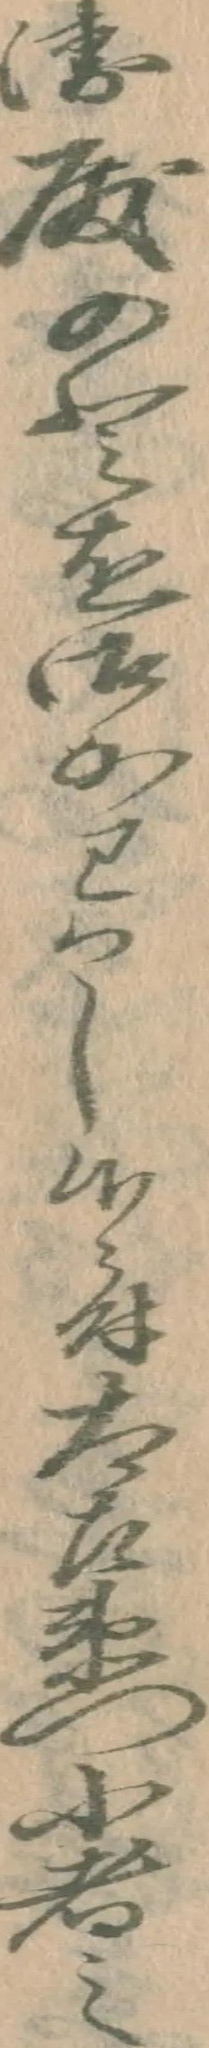衛殿の登を御か已かし候に付太左衛門小者之
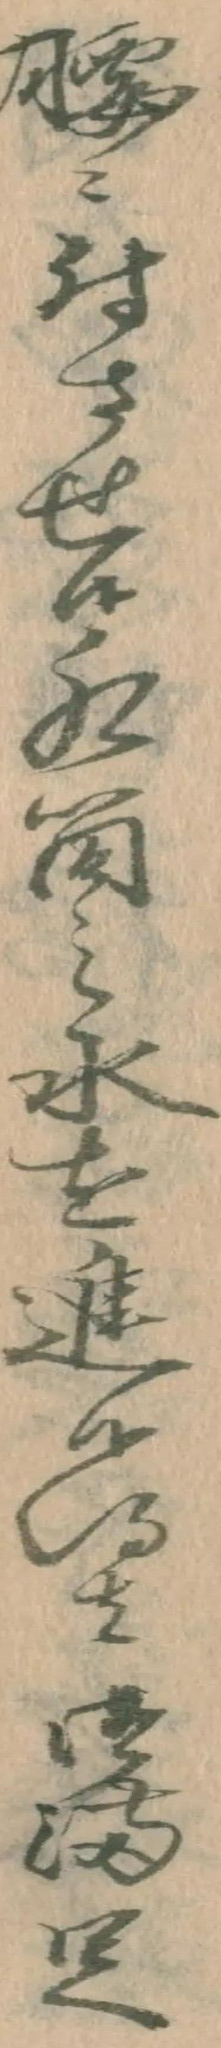腰に付させ候水筒之水を進候得者御満足
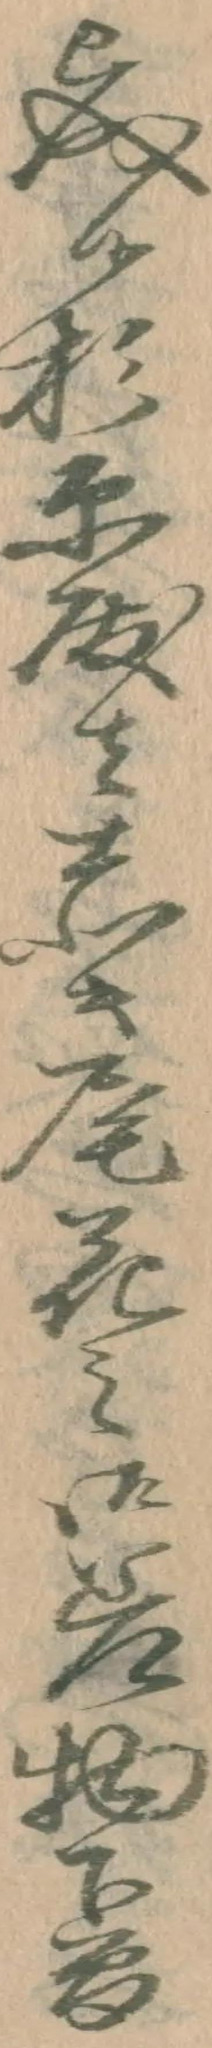被成候杉原殿者赤き尾花之御差物下曽
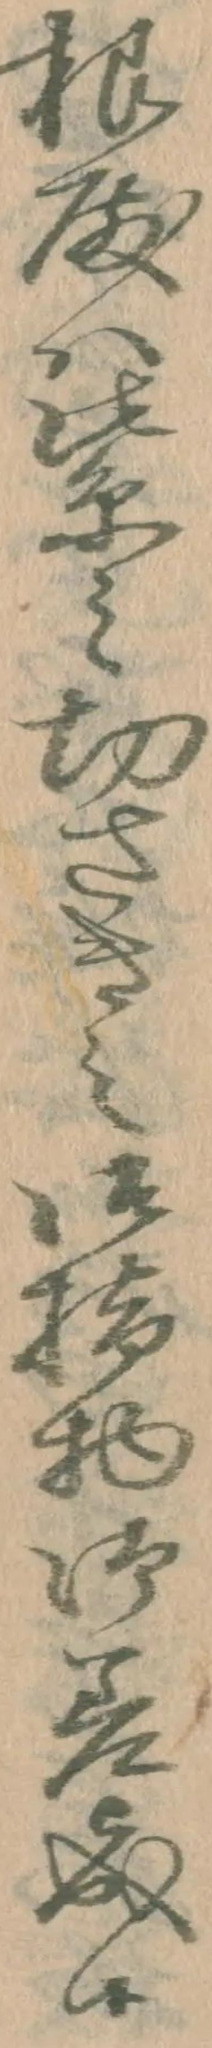根殿は紫之切さき之御指物御差被成候
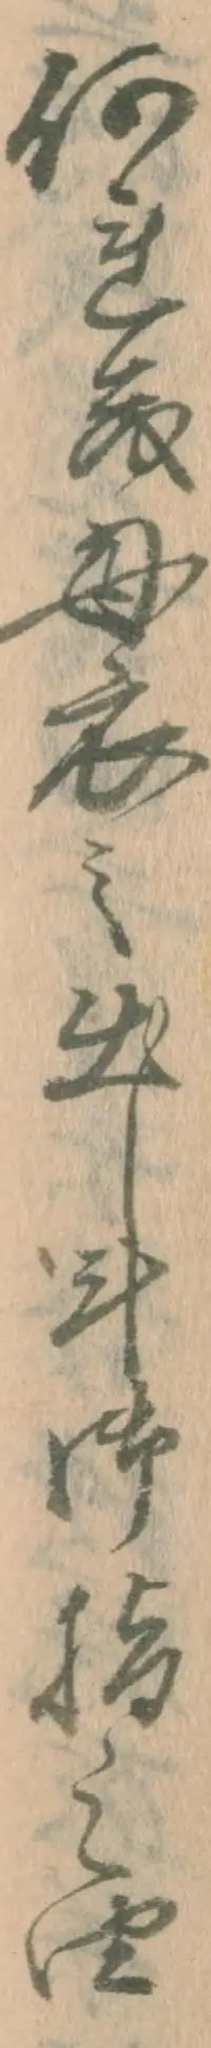何連茂母衣之出し斗御指之由
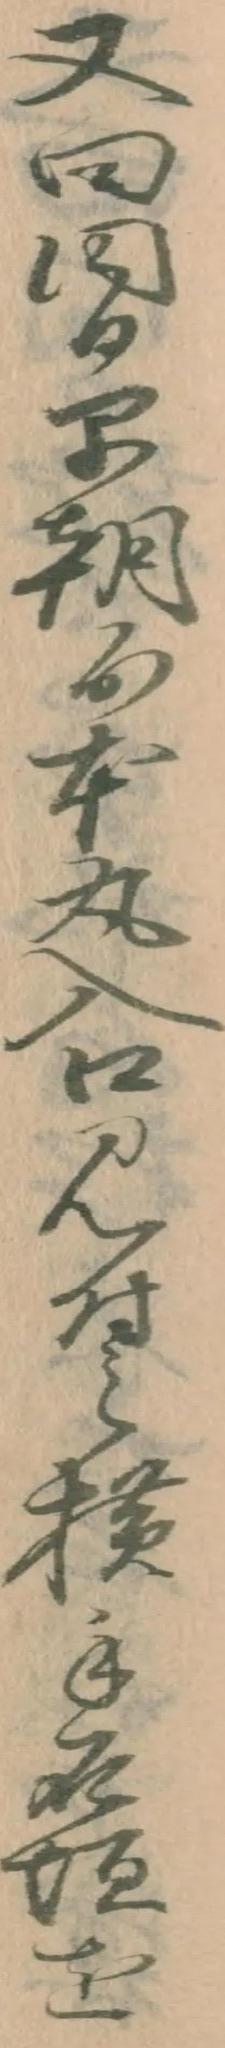又曰同日早朝ゟ本丸入口見付之横手石垣を
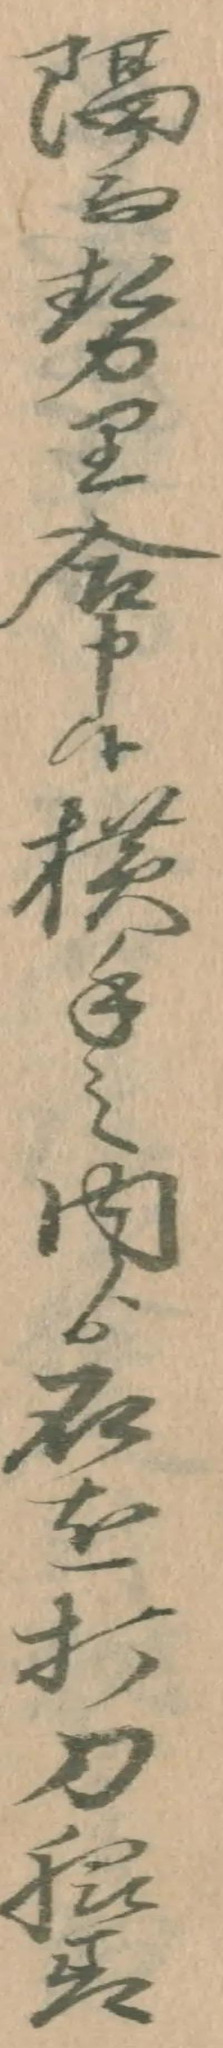隔而勢里合申候横手之内ゟ石を打刀脇差
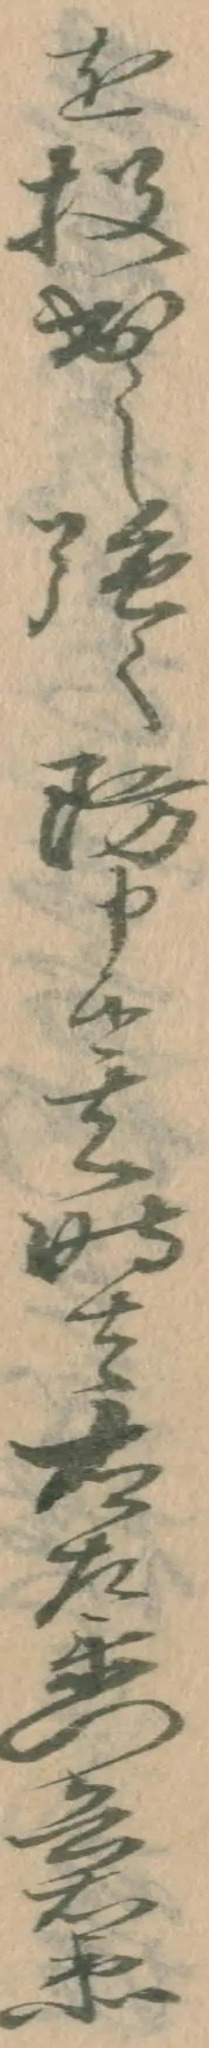を投出し強く防申候其時者太左衛門兵右衛
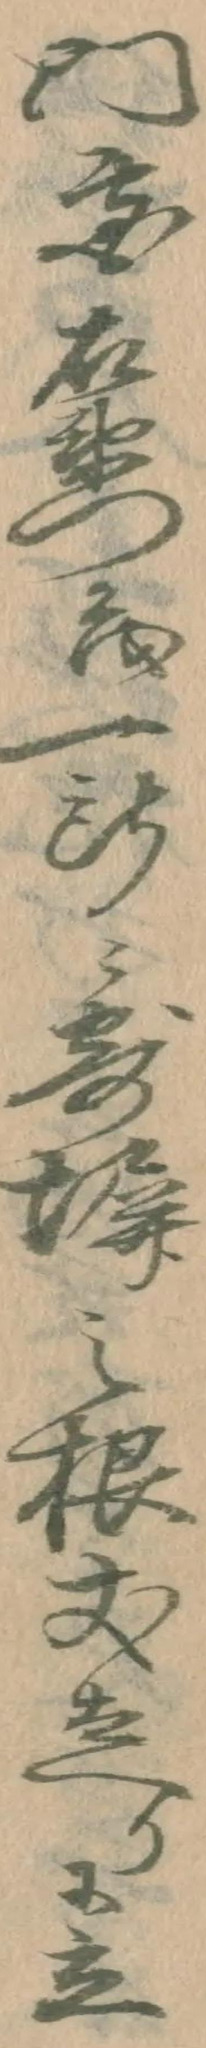門甚右衛門茂一所に寄塀之根丈辺り尓立
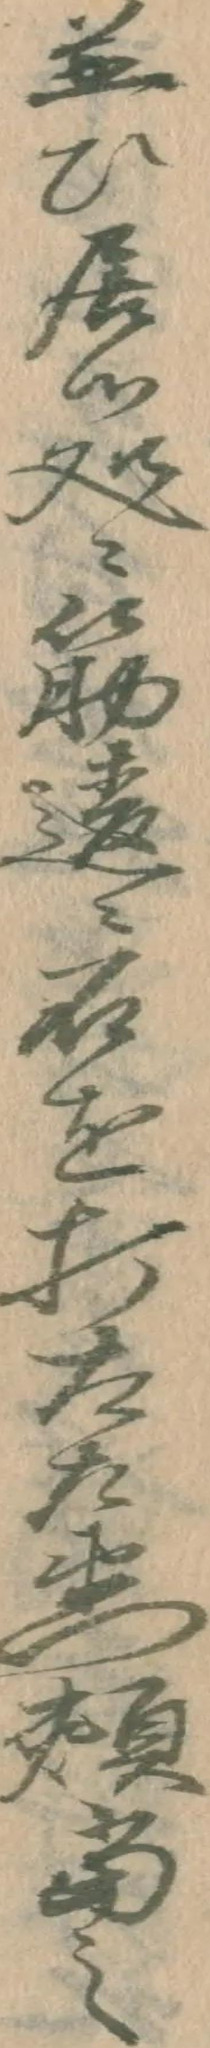並ひ居候処に筋違に石を打太左衛門頬当之
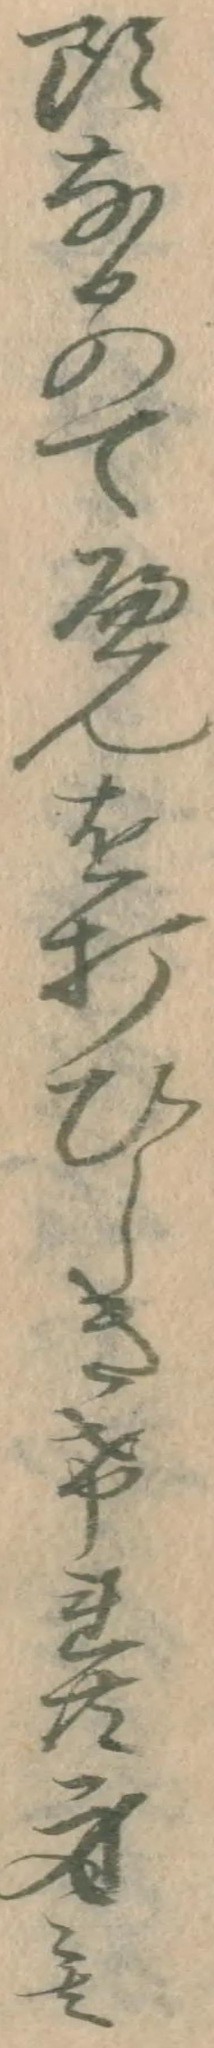頭なかのて扁んを打ひしき希連共身に者
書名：切支丹御退治記 49巻. [8]
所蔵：国立国会図書館 National Diet Library, JAPAN
